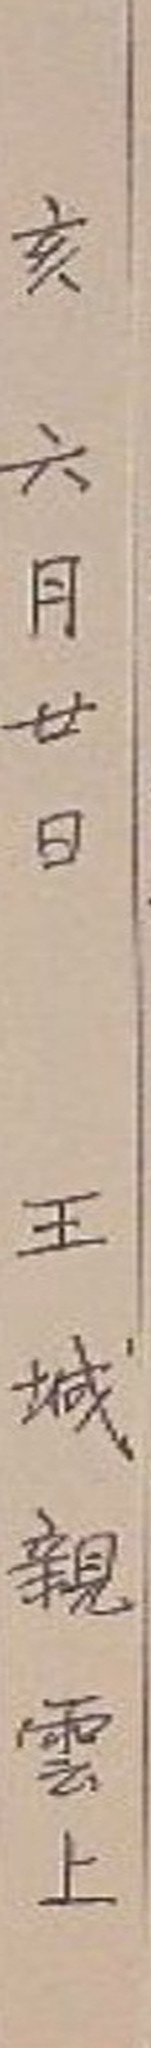亥六月廿日王城親雲上
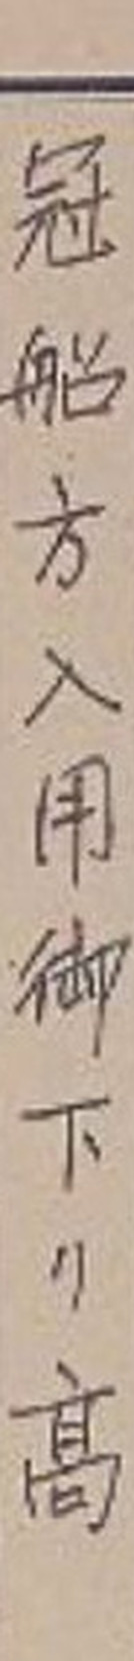冠船方入用御下り高
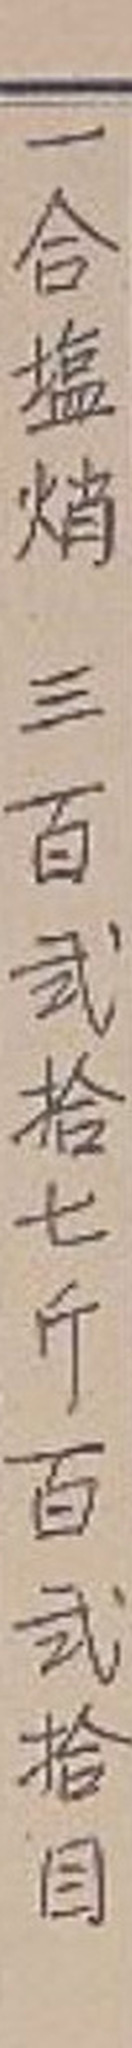一合塩硝三百弐拾七斤百弐拾目
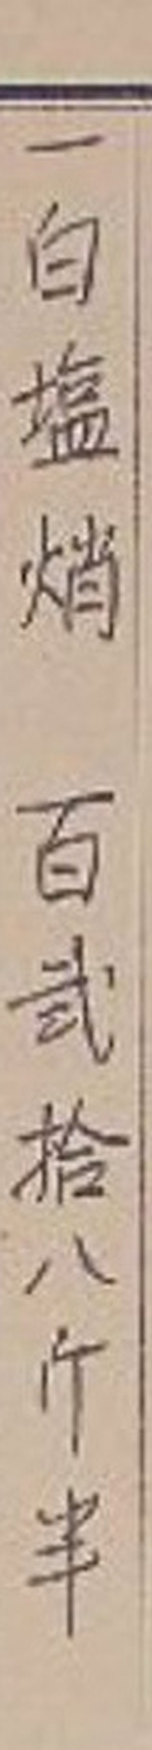一白塩硝百弐拾八斤半
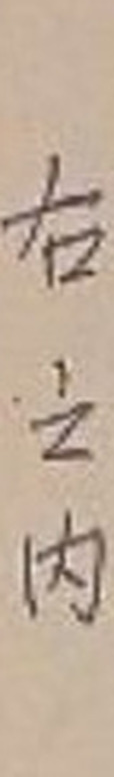右之内
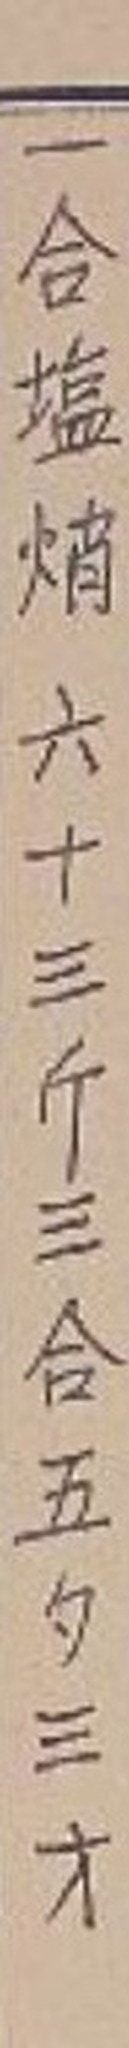一合塩硝六十三斤三合五勺三才
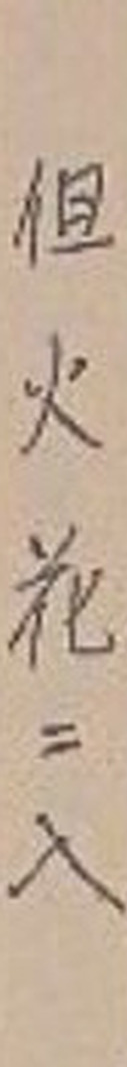但火花に入
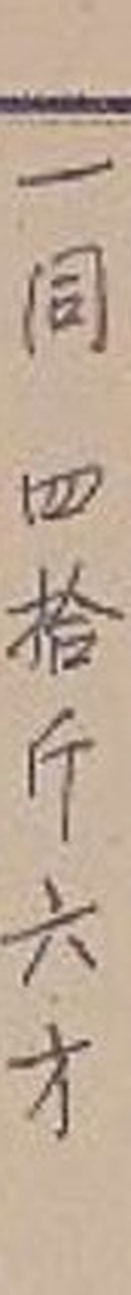一同四拾斤六才
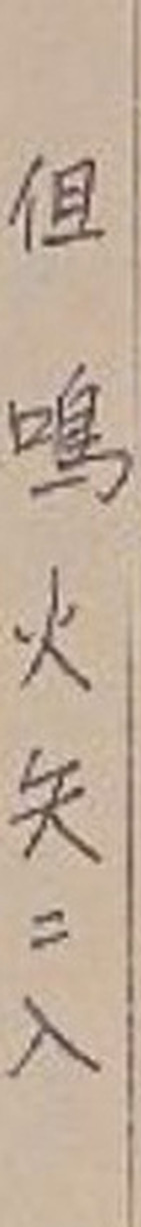但鳴火矢に入
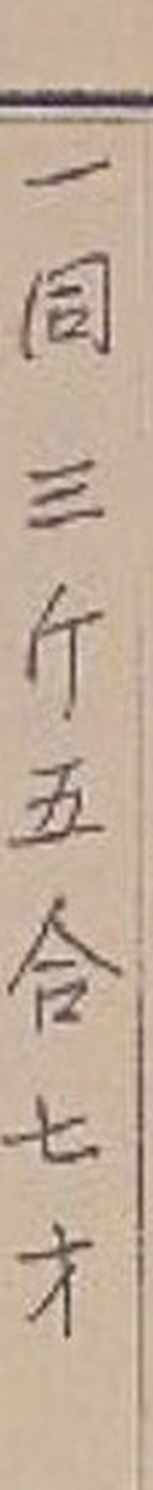一同三斤五合七才
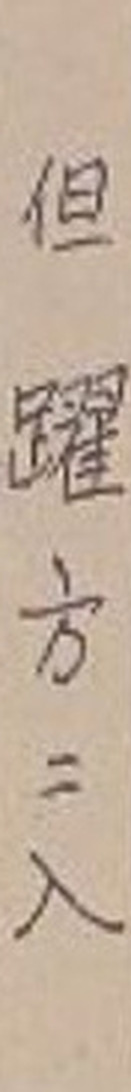但躍方に入
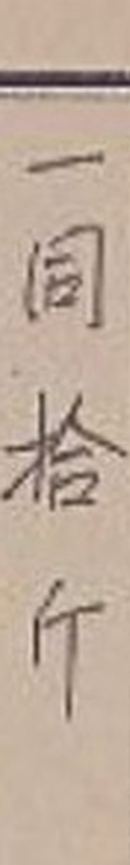一同拾斤
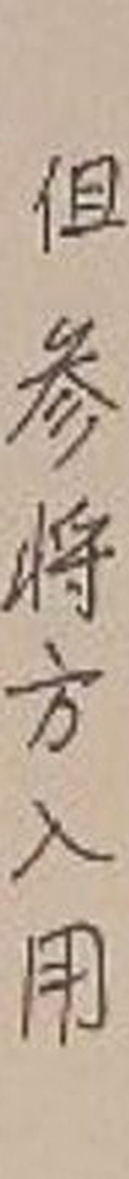但参将方入用
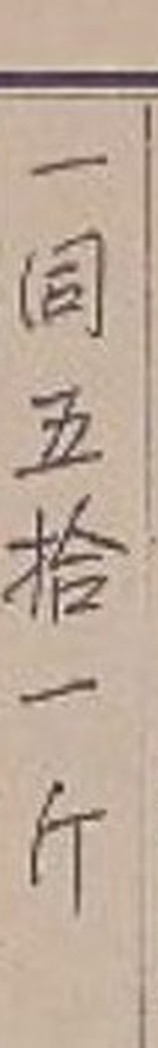一同五拾一斤
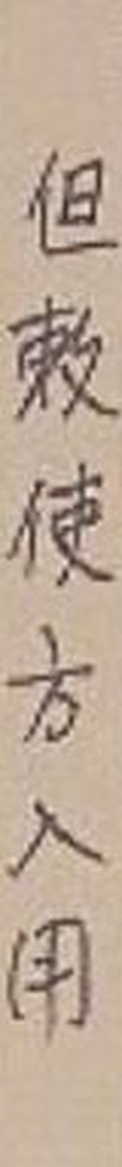但勅使方入用
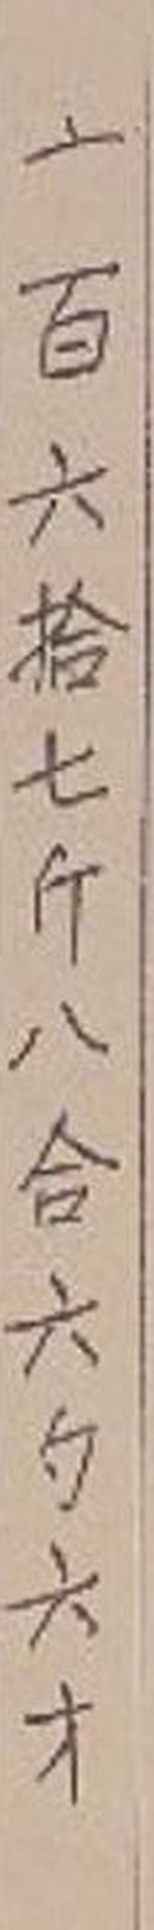〆百六拾七斤八合六勺六才
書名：支那冊封使来琉諸記 下巻
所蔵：University of the Ryukyus Library
